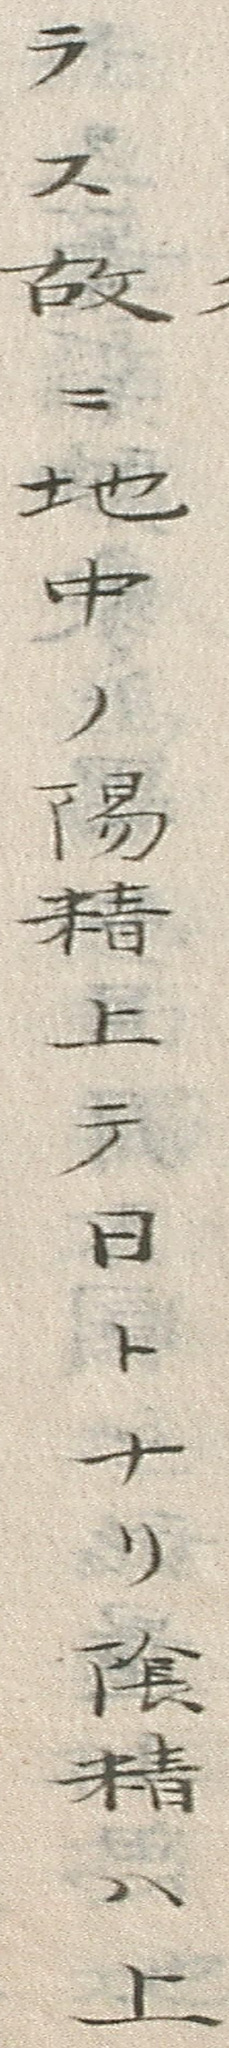ラス故ニ地中ノ陽精上テ日トナリ陰精ハ上
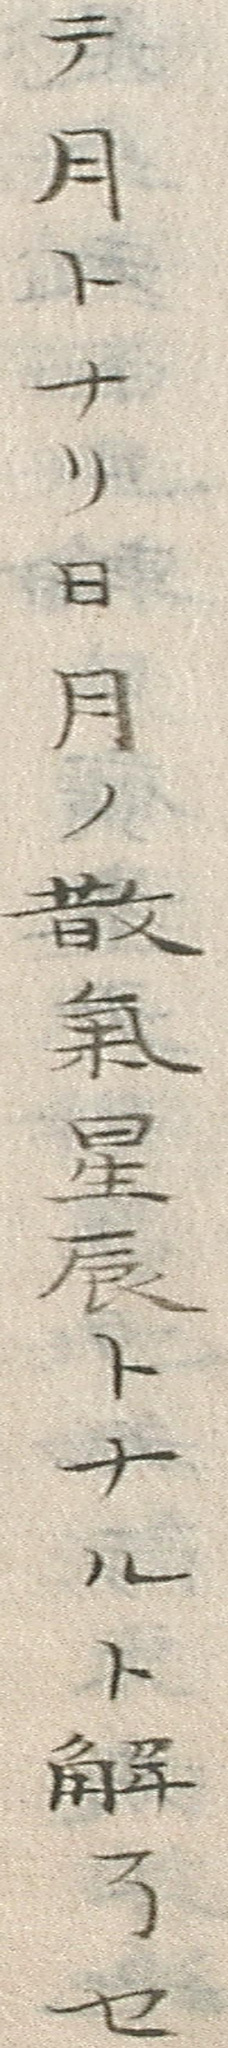テ月トナリ日月ノ散気星辰トナルト解了セ
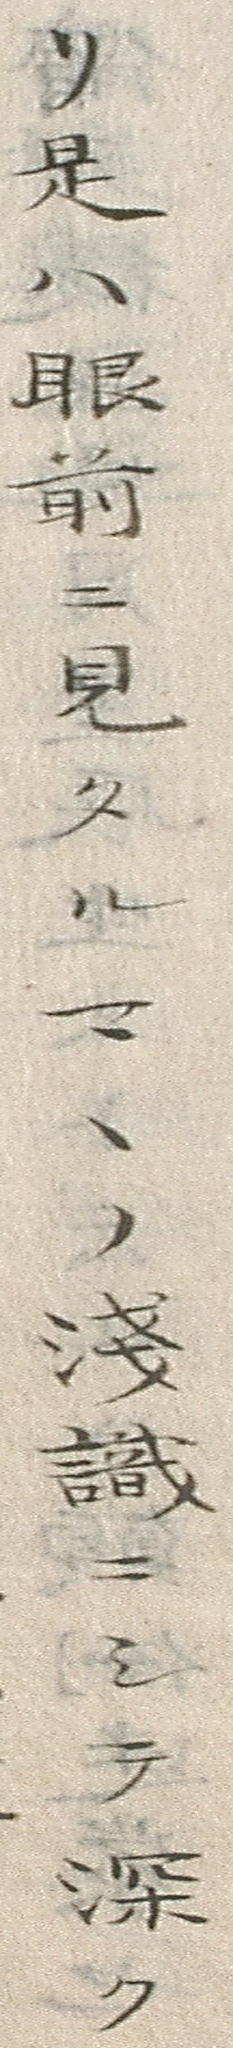リ是ハ眼前ニ見タルマヽノ浅識ニシテ深ク
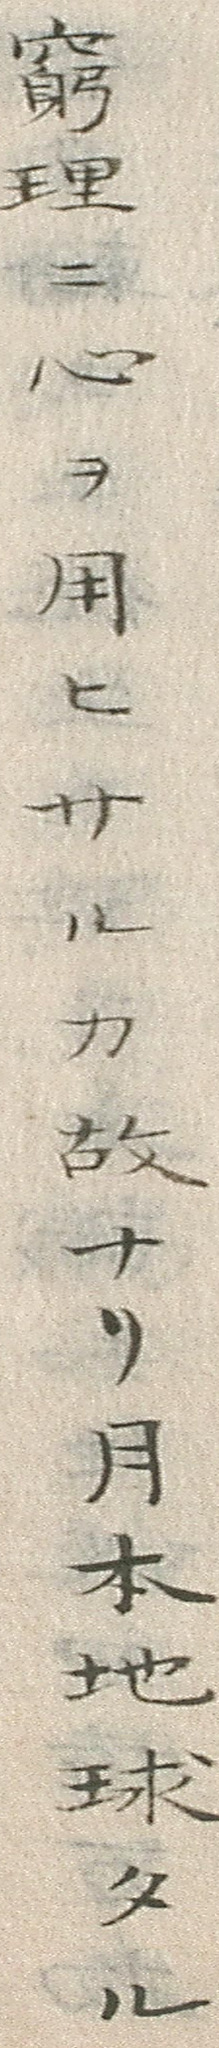窮理ニ心ヲ用ヒサルカ故ナリ月本地球タル
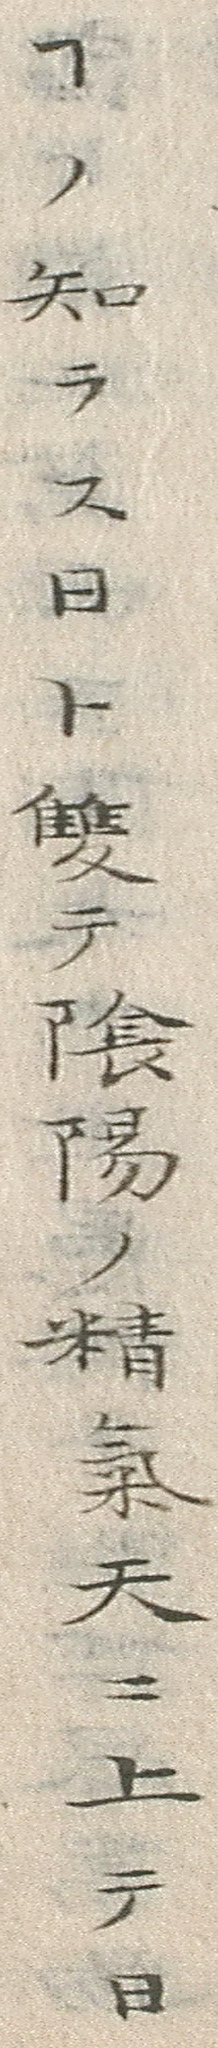コトノ知ラス日ト雙テ陰陽ノ精気天ニ上テ日
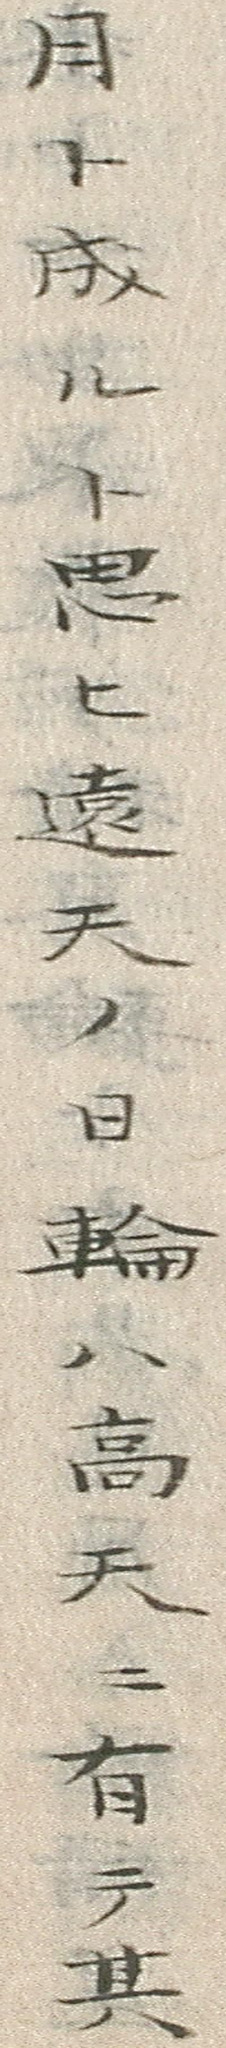月ト成ルト思ヒ遠天ノ日輪ハ高天ニ有テ其
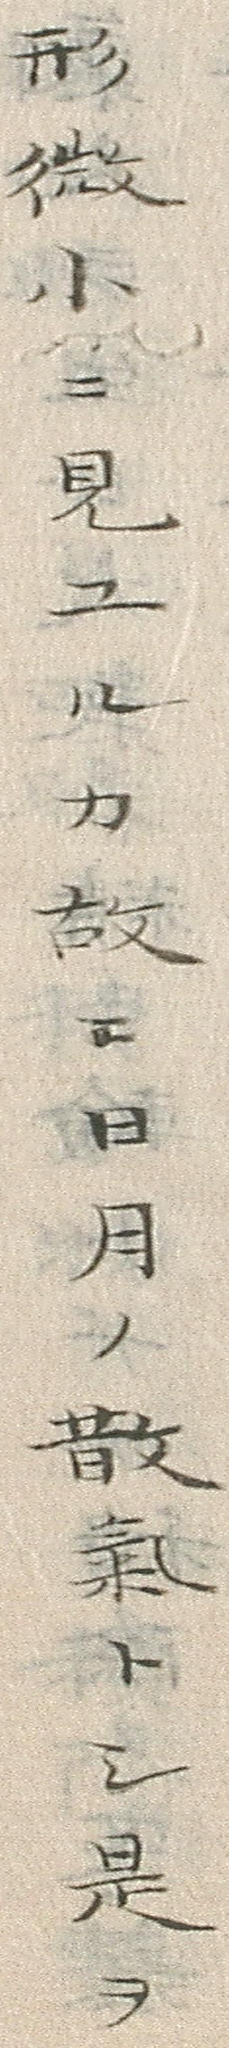形微小ニ見ユルカ故ニ日月ノ散気トシ是ヲ
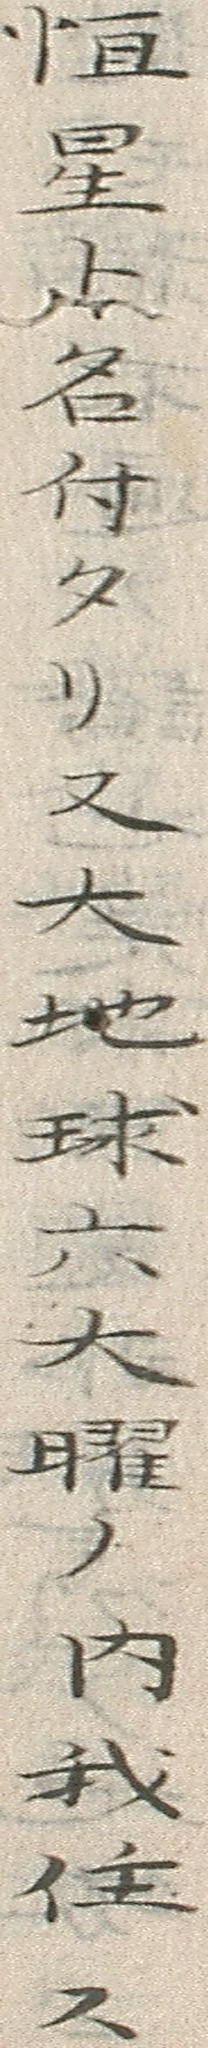恒星ト名付タリ又大地球六大曜ノ内我住ス
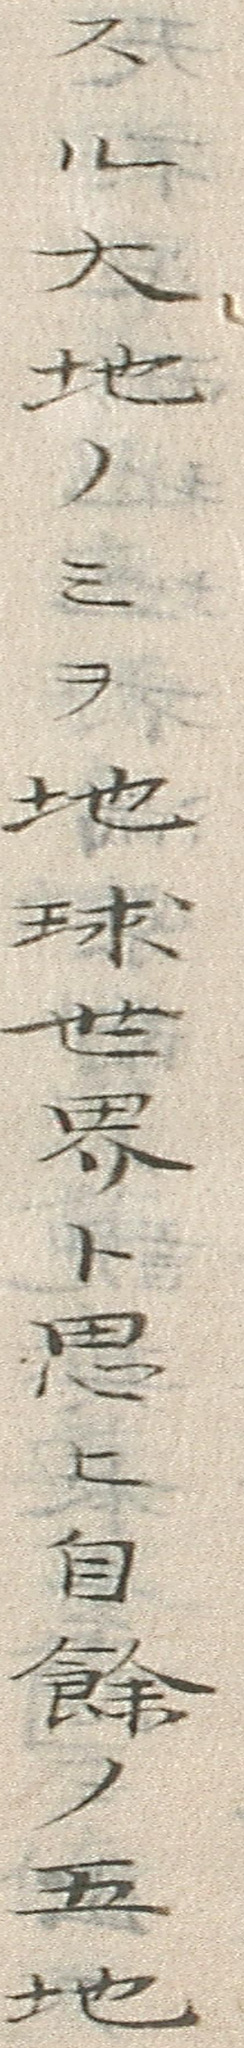スル大地ノミヲ地球世界ト思ヒ自余ノ五地
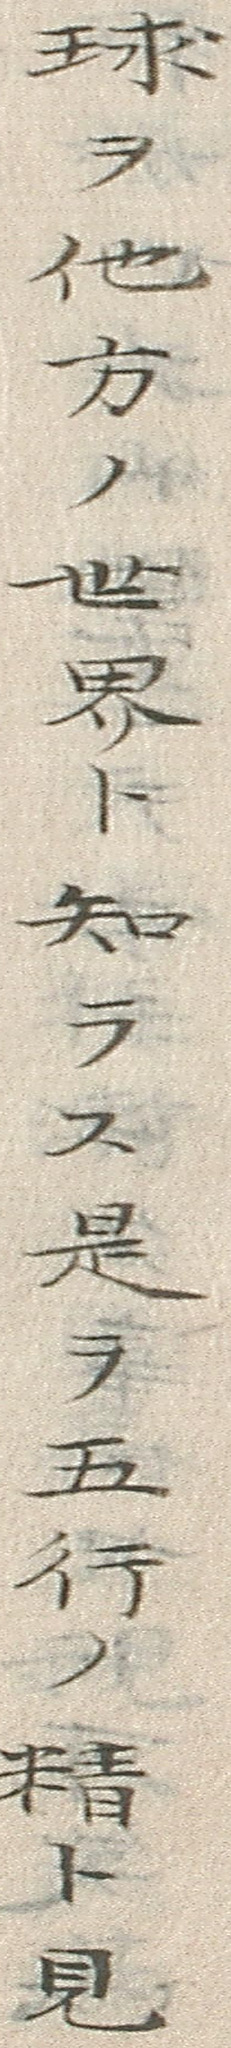球ヲ他方ノ世界ト知ラス是ヲ五行ノ精ト見
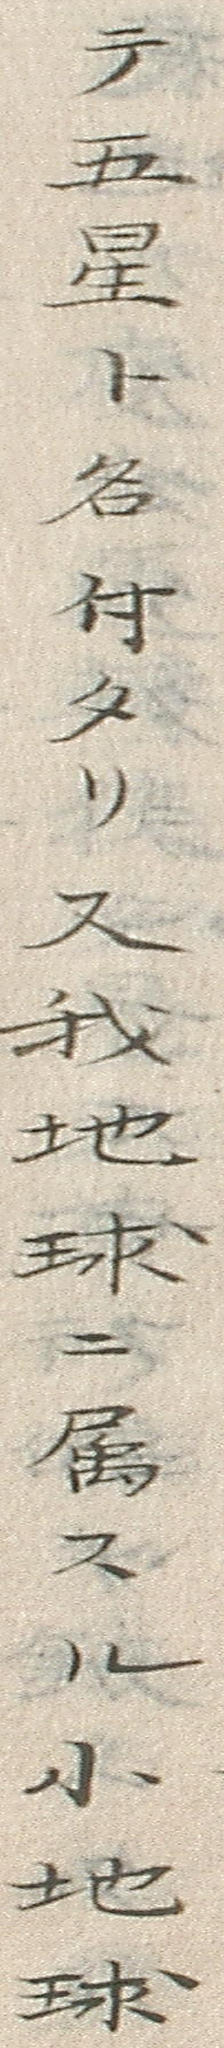テ五星ト名付タリ我地球ニ属スル小地球
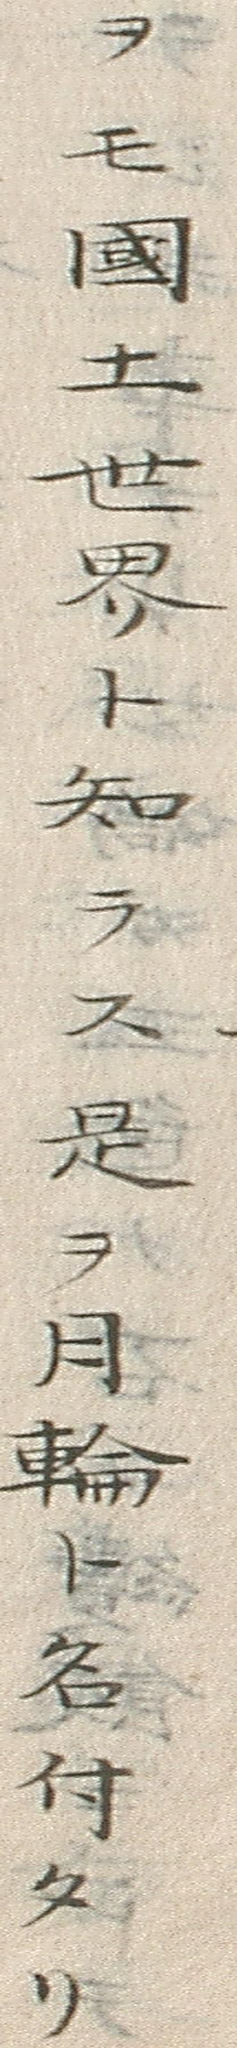ヲモ国土世界ト知ラス是ヲ月輪ト名付タリ
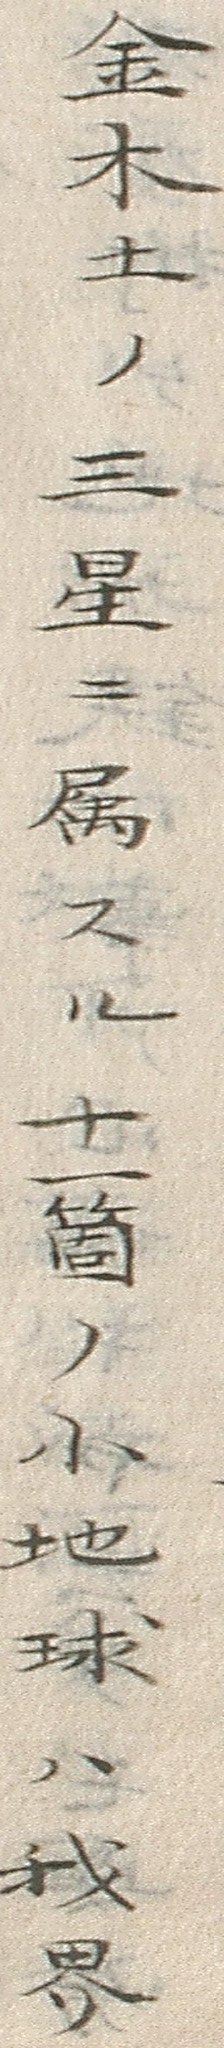金木土ノ三星ニ属スル十一箇ノ小地球ハ我界
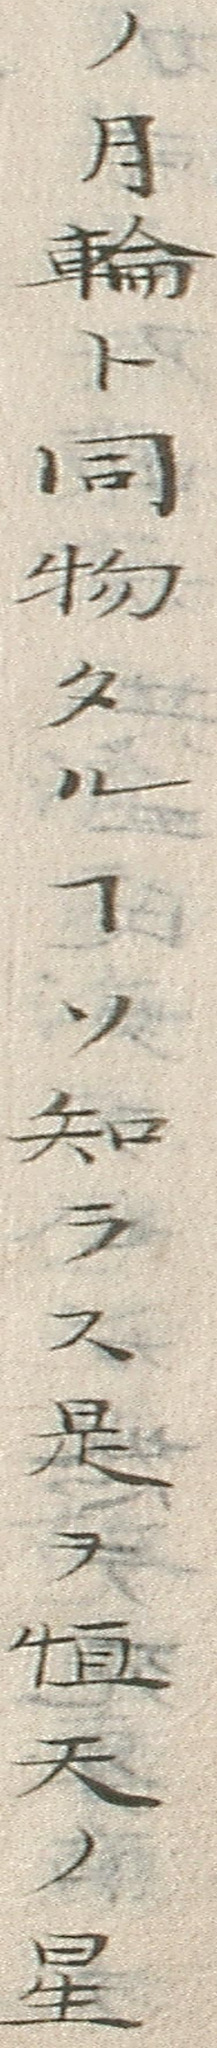ノ月輪ト同物タルコトソ知ラス是ヲ恒天ノ星
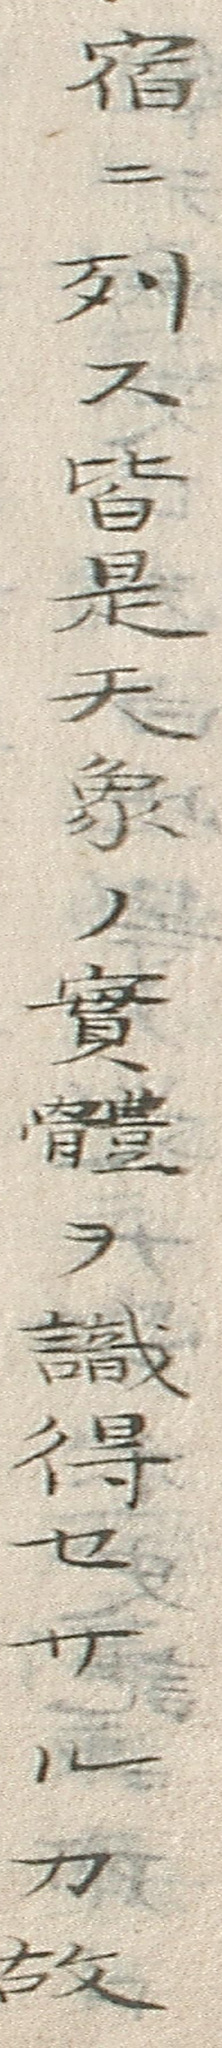宿ニ列ス皆是天象ノ実体ヲ識得セサルカ故
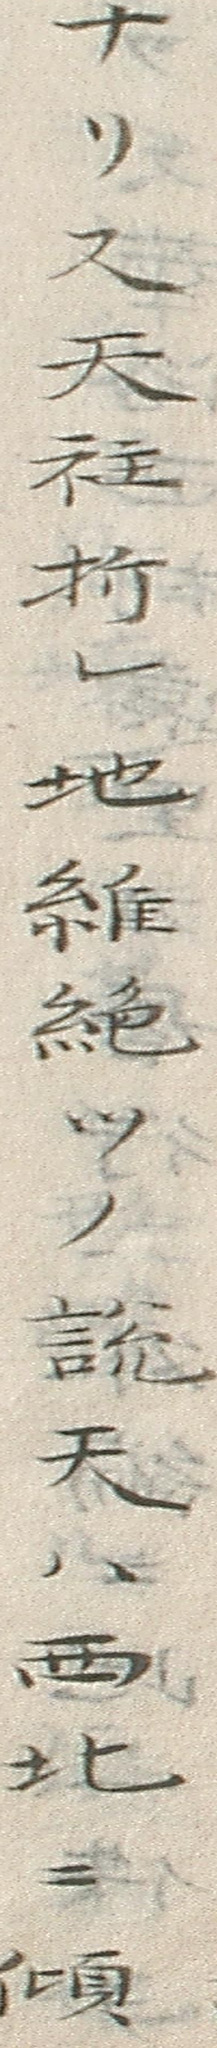ナリ又天柱折レ地維絶ツノ説天ハ西北ニ傾
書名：天學略名目羽翼　全
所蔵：東京大学地震研究所図書室 Earthquake Research Institute Library, The University of Tokyo, JAPAN
